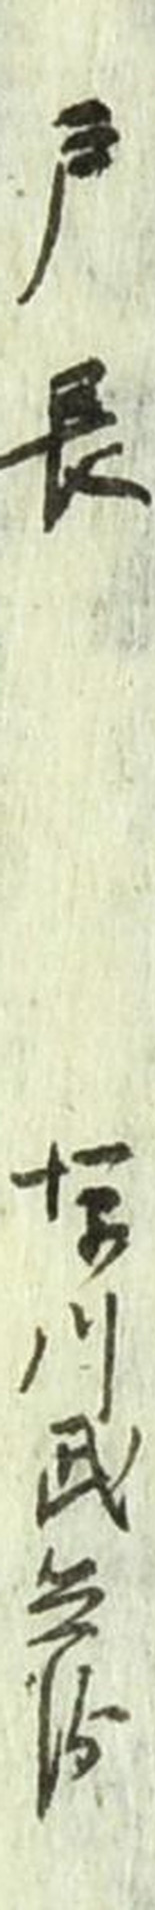戸長坪川武兵衛
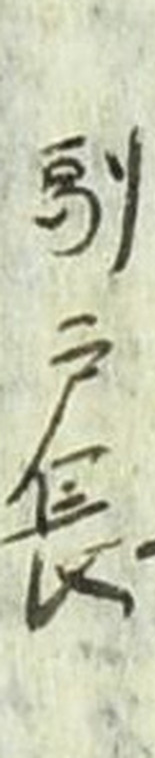副区長
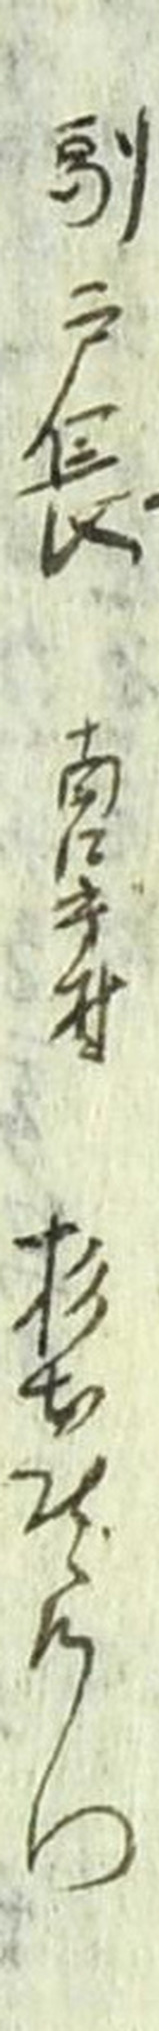副戸長南江守村杉本次郎左衛門
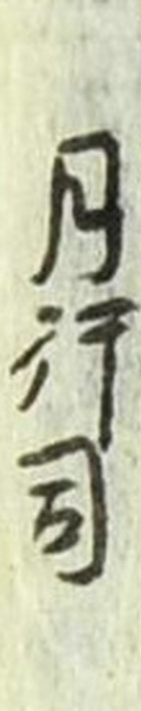月行司
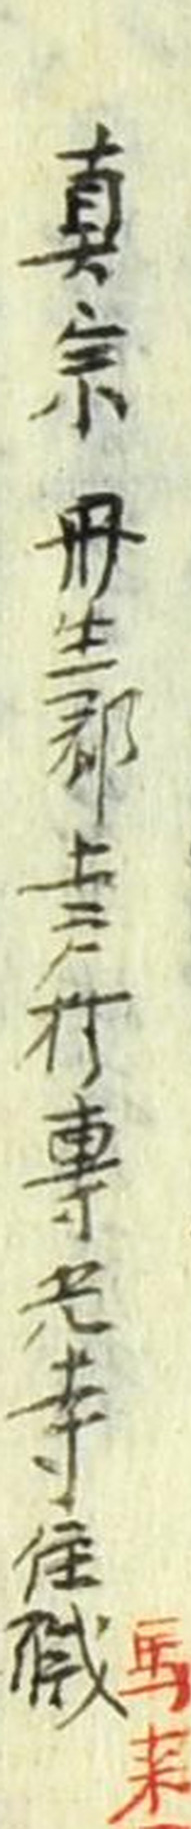真宗丹生郡上戸村専光寺住職
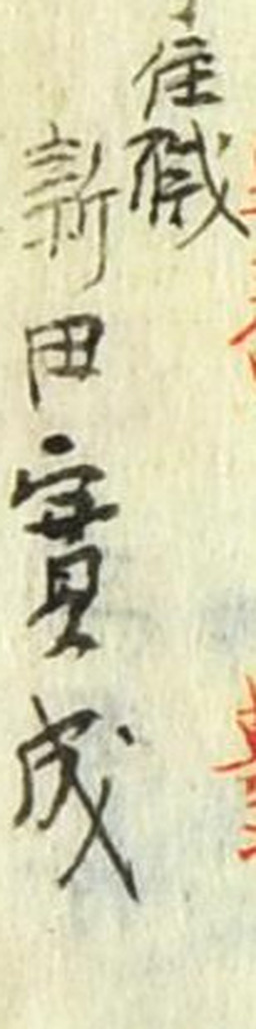新田実成

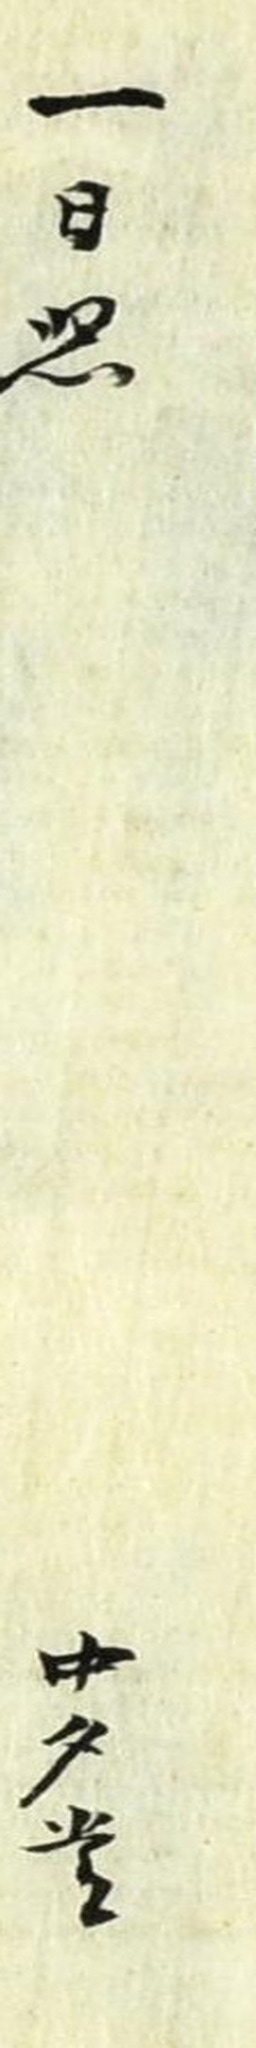一日照中夕常
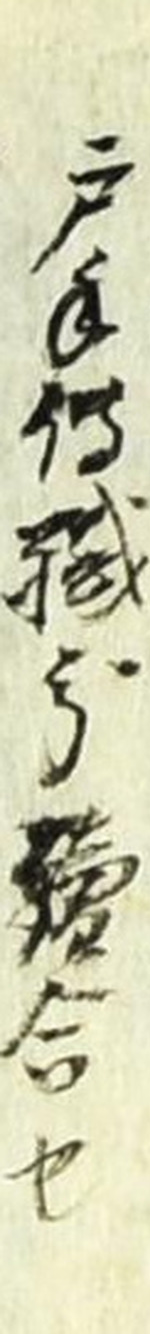戸手伝職分読合セ
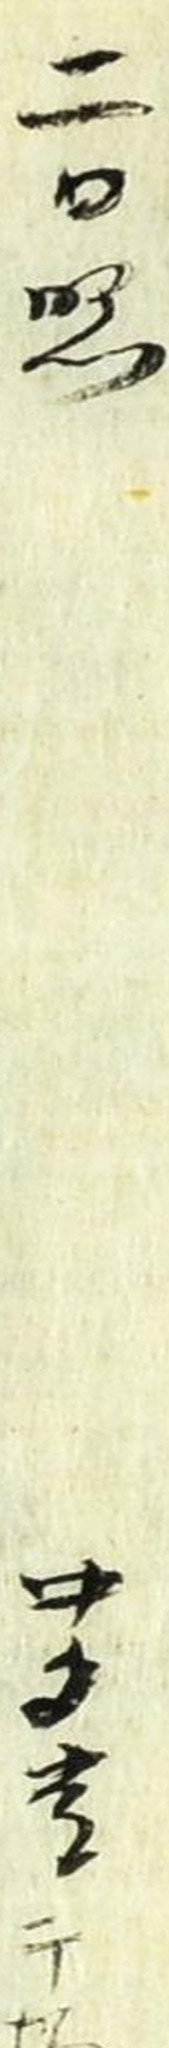一日照中夕常
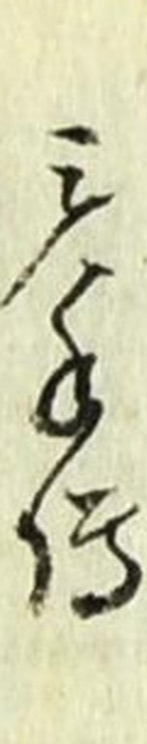戸手伝
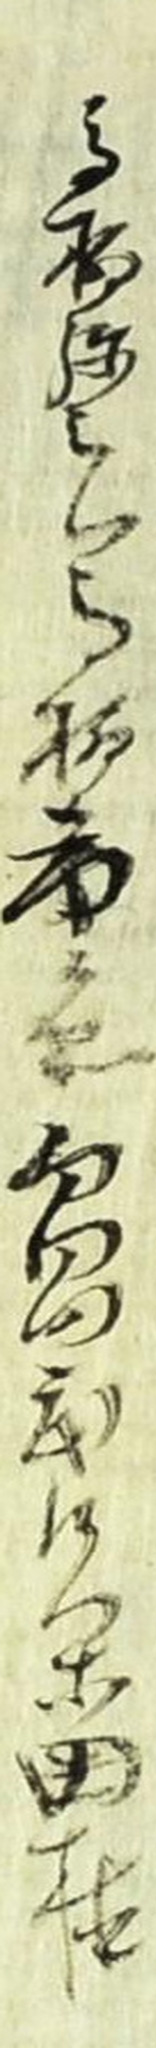高柳弥三右衛門高柳市兵衛向畠武左衛門等田植
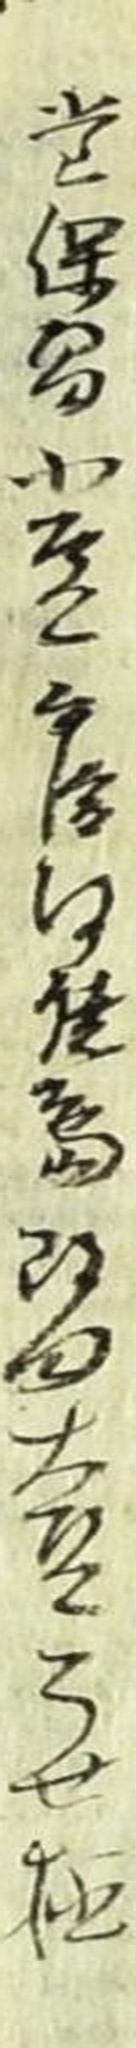堂保畠小豆午後河饒島改田大豆うせ植
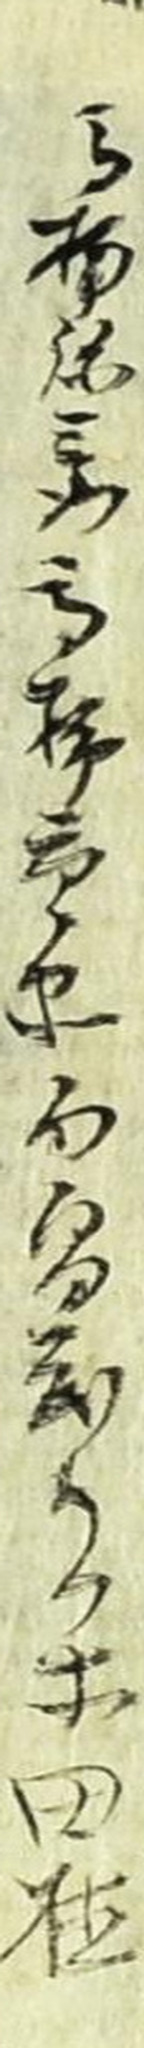高柳弥三右衛門高柳市兵衛向畠武左衛門等田植
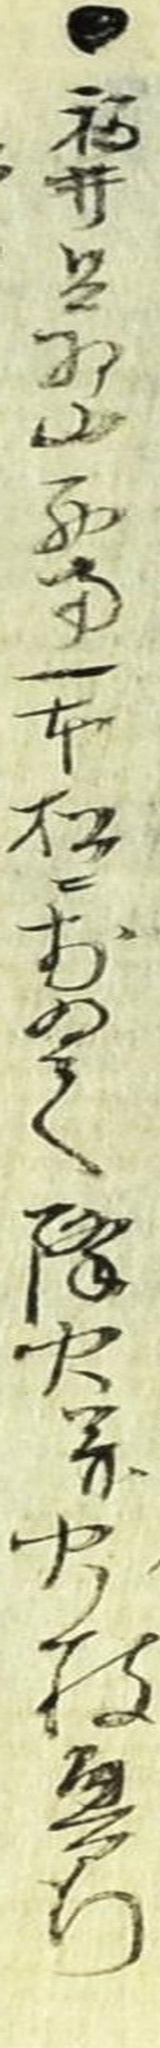●福井足羽山西南一本松ニおゐて鋒火幷火枝興行
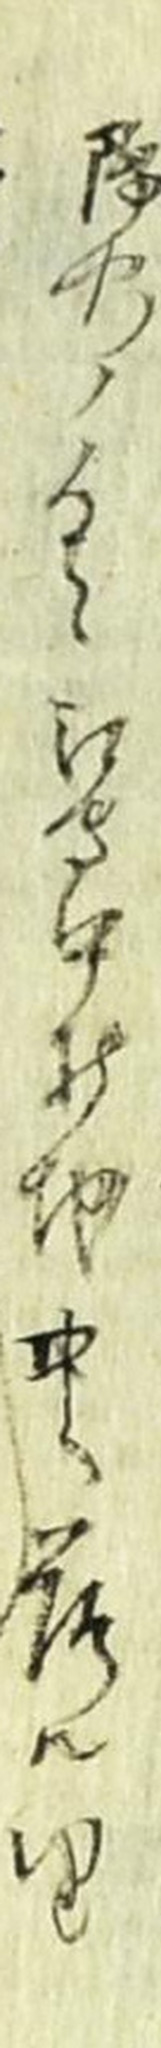鋒火ノ具江守中村地中へ落ル由
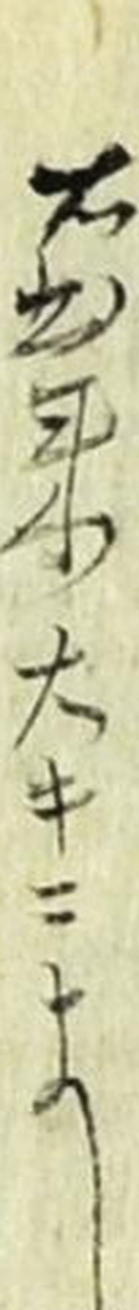右出来大キニよし
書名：（日記）
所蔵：福井県文書館 Fukui Prefectural Archives
